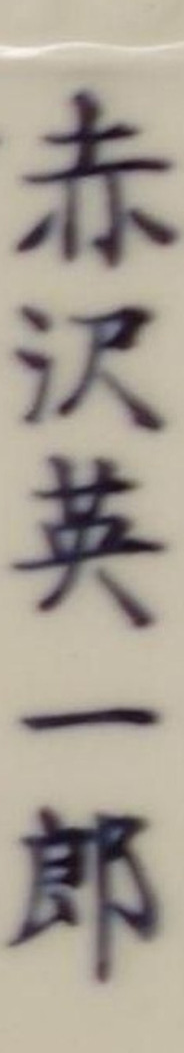赤沢英一郎
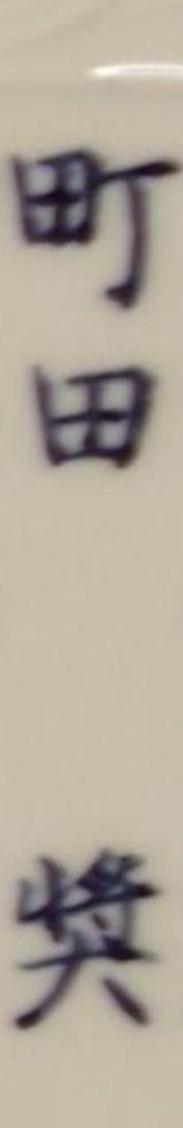町田奨
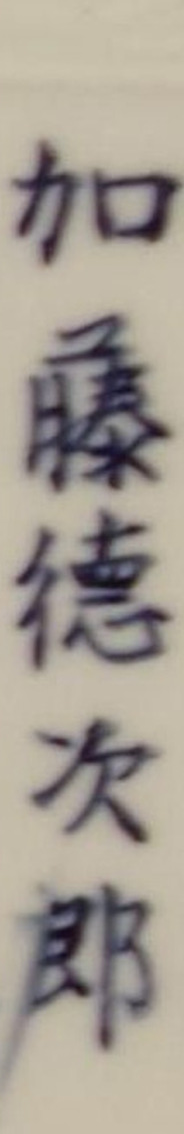加藤徳次郎
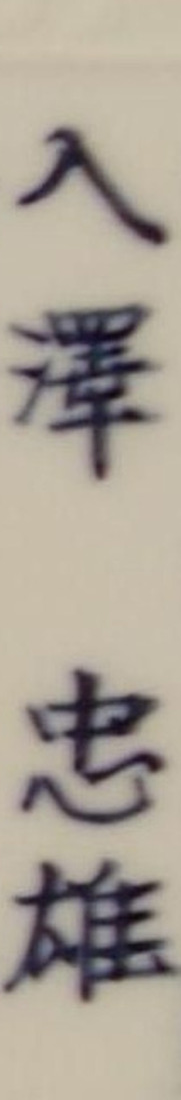入澤忠雄
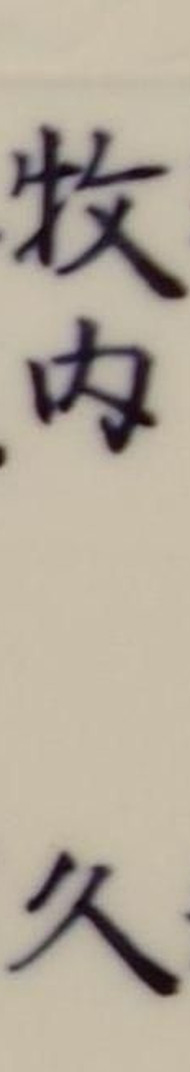牧内久
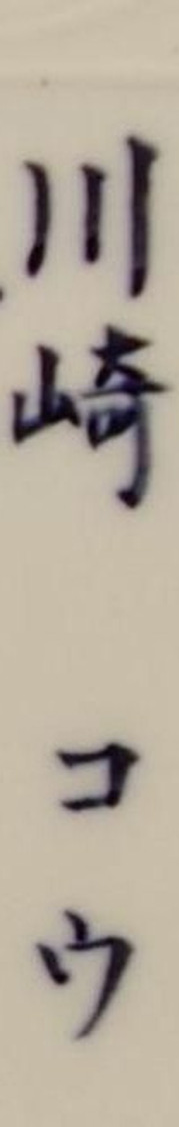川崎コウ
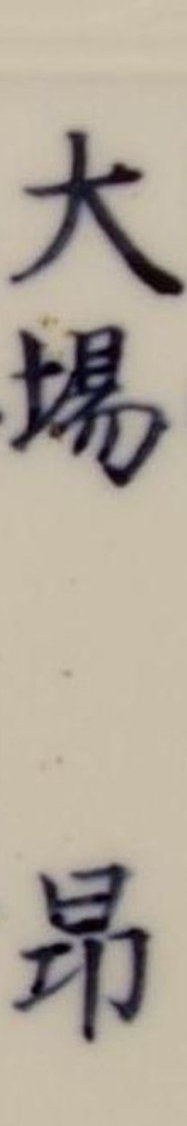大場昴
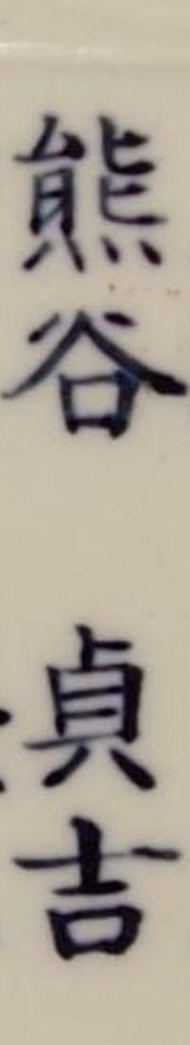熊谷貞吉
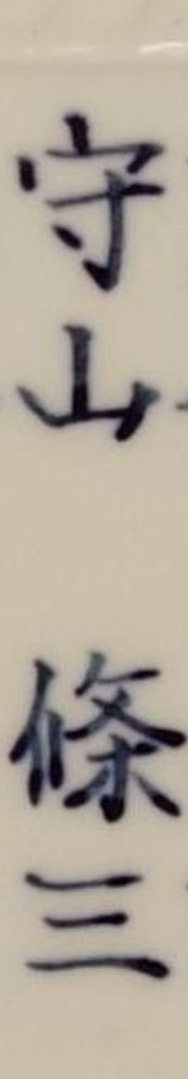守山條三
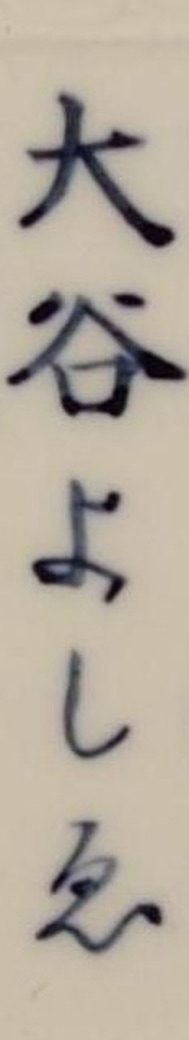大谷よしえ
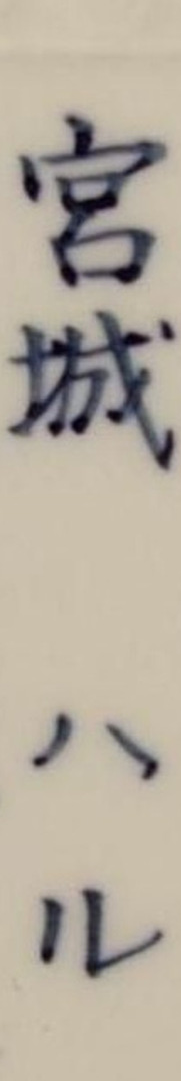宮城ハル
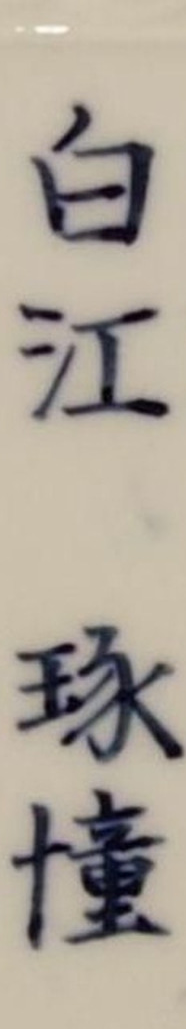白江琢憧
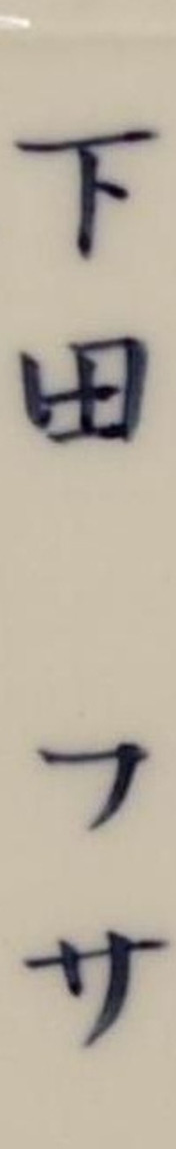下田フサ
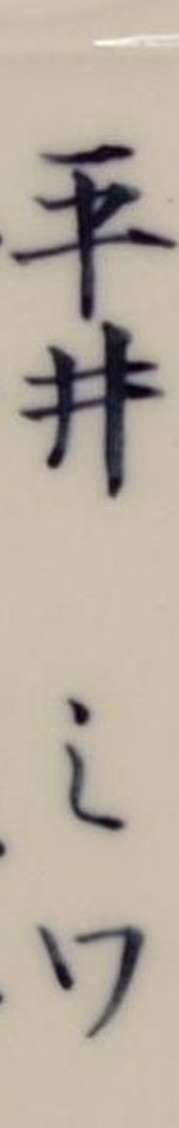平井ミワ
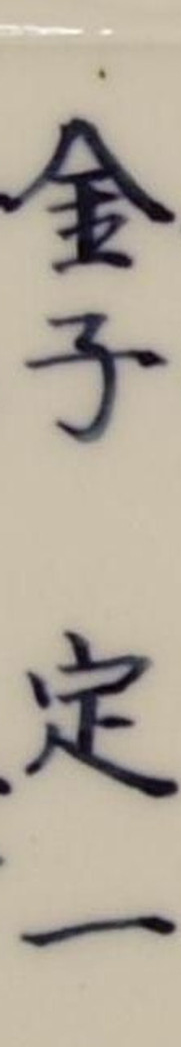金子定一
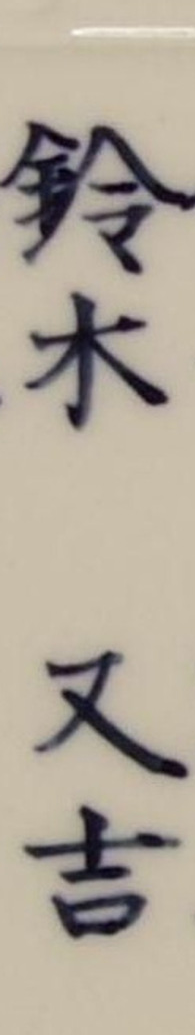鈴木又吉
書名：E~L
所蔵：高野山金剛峯寺
